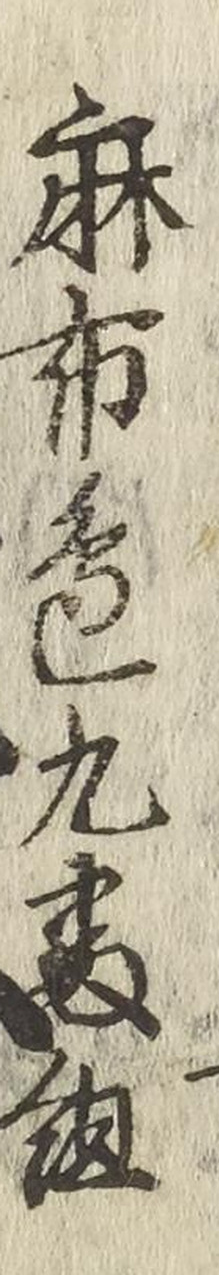麻布辺九番組
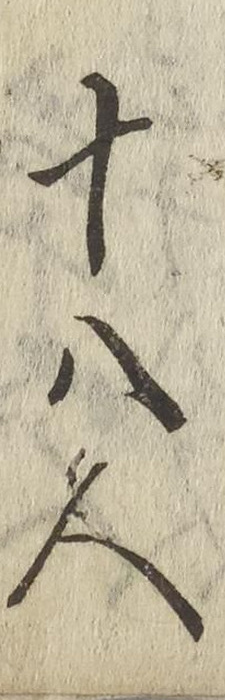女八人
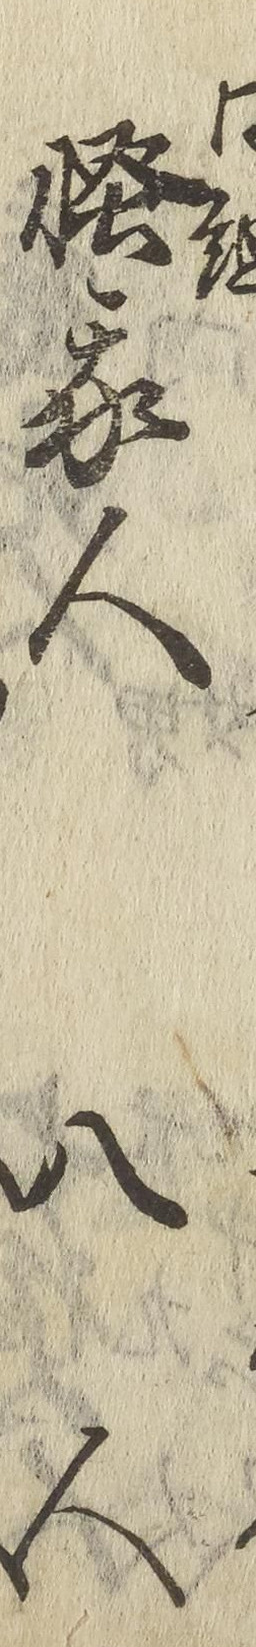怪我人八人
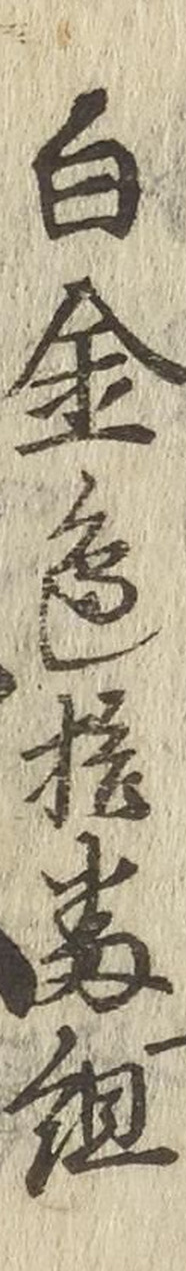白金辺拾番組
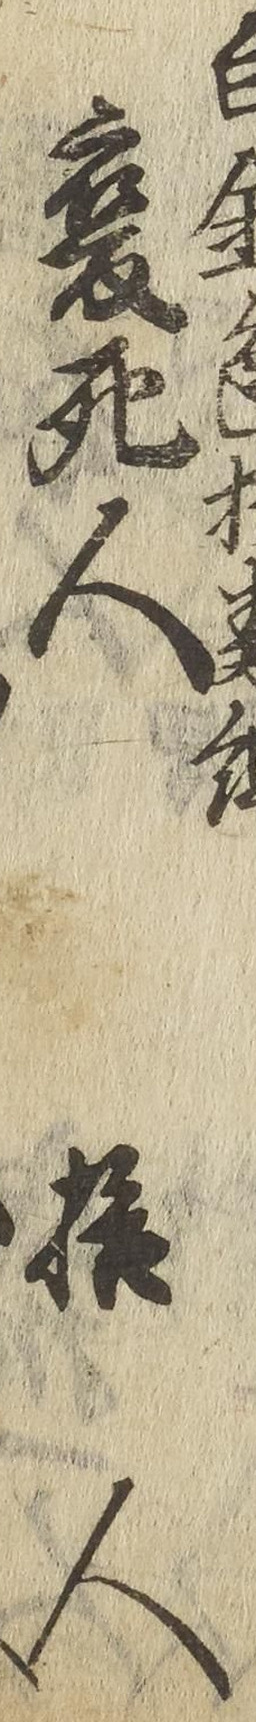変死人拾人

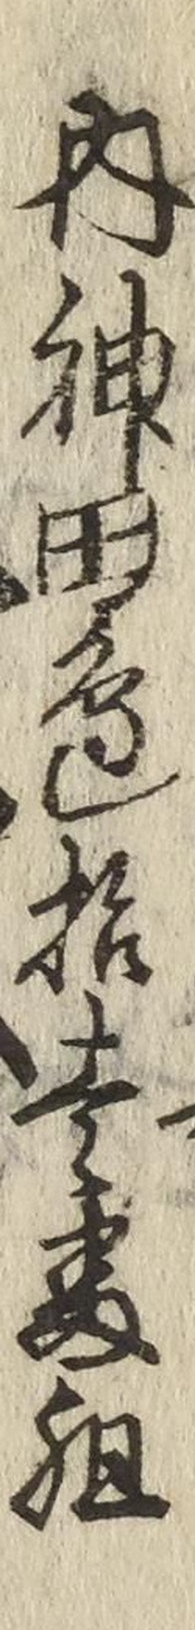内神田辺拾壱番組
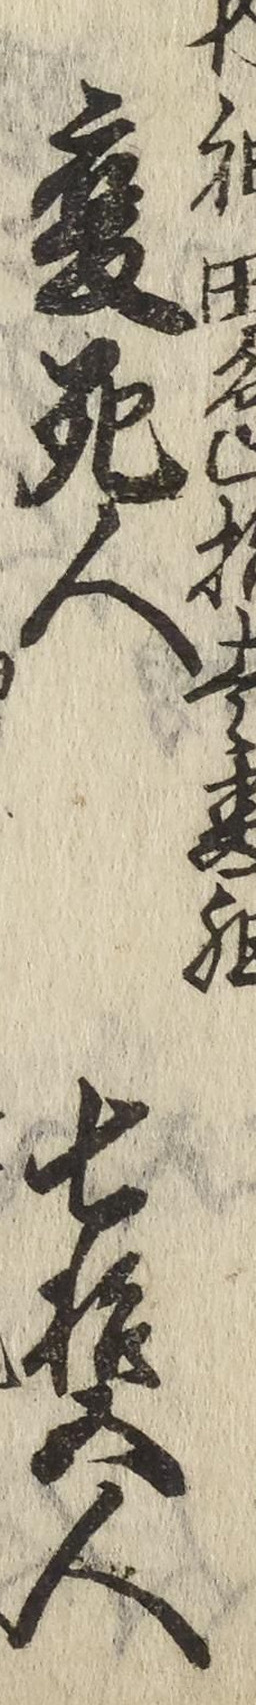変死人七拾五人
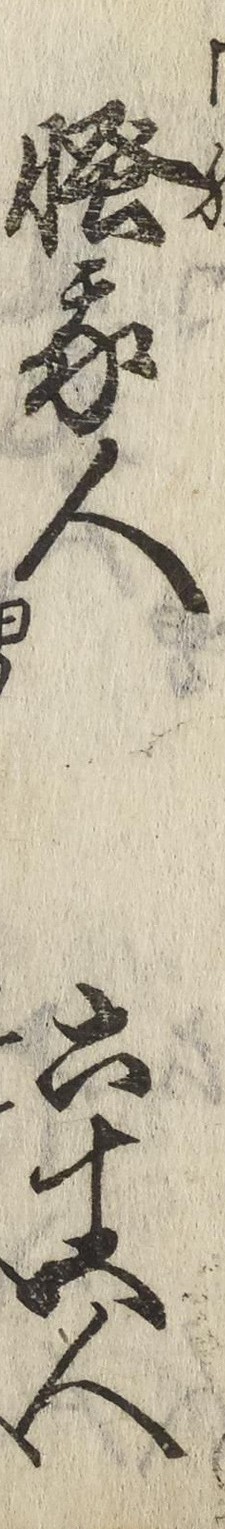怪我人六十五人
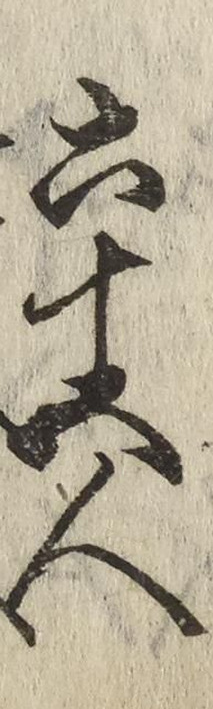女十五人
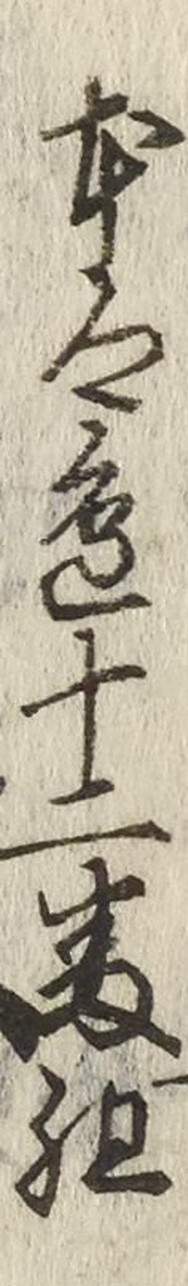本郷辺十二番組
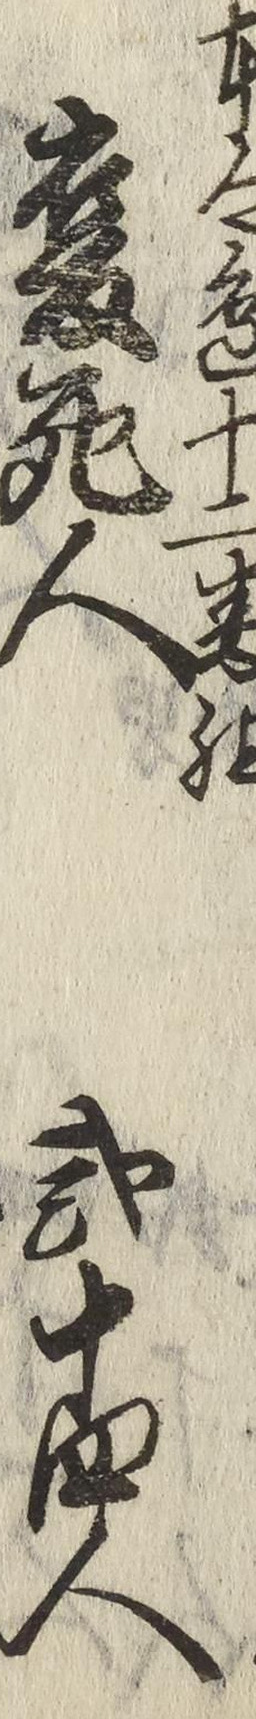変死人弐十四人
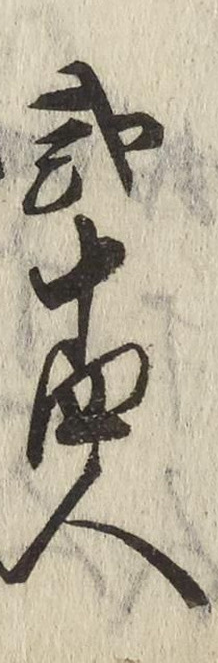女十四人
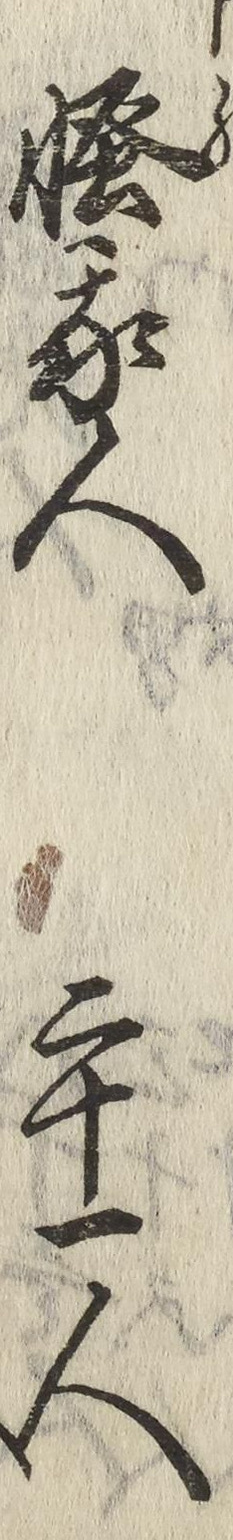怪我人二十一人
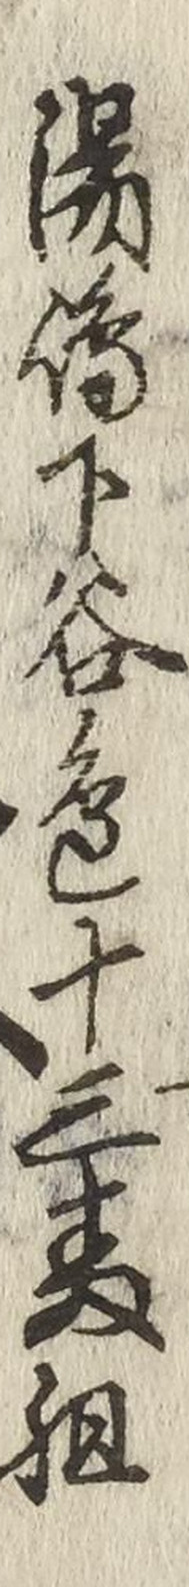湯嶋下谷辺十三番組
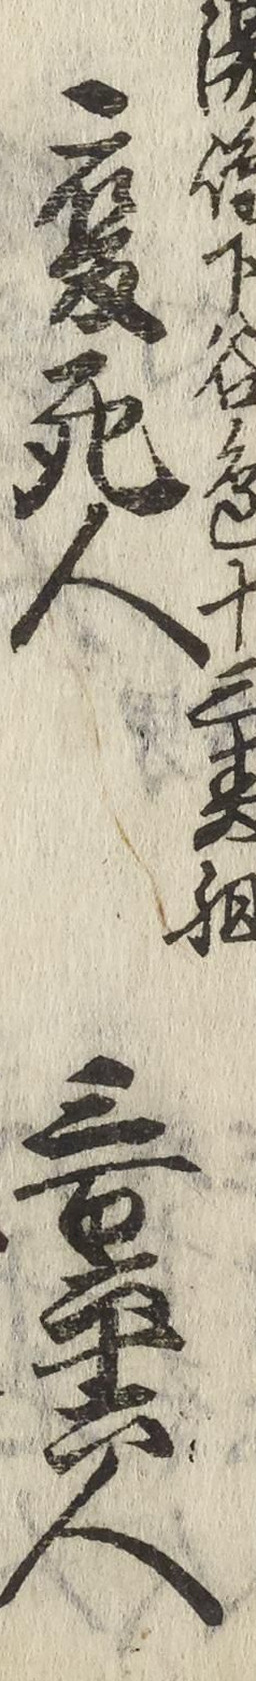変死人三百六十六人
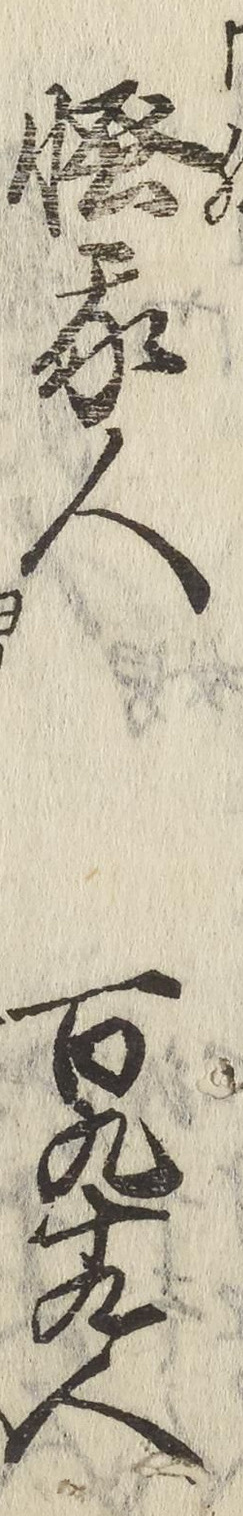怪我人百九十九人
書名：地震出火　男女死人怪我人書上之寫
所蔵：東京大学地震研究所図書室 Earthquake Research Institute Library, The University of Tokyo, JAPAN
